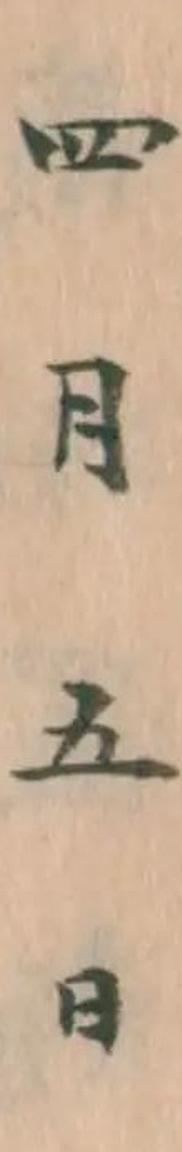四月五日
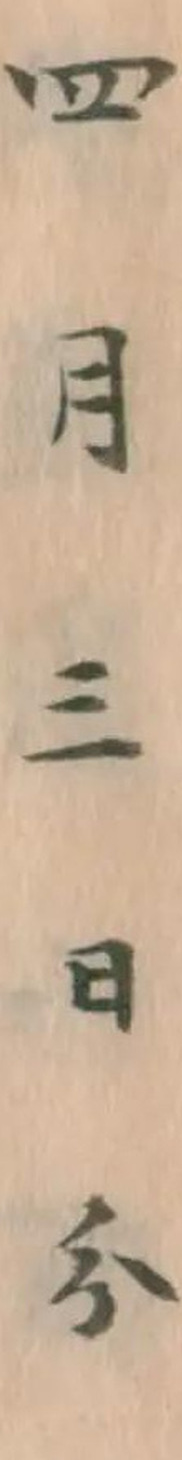四月三日分
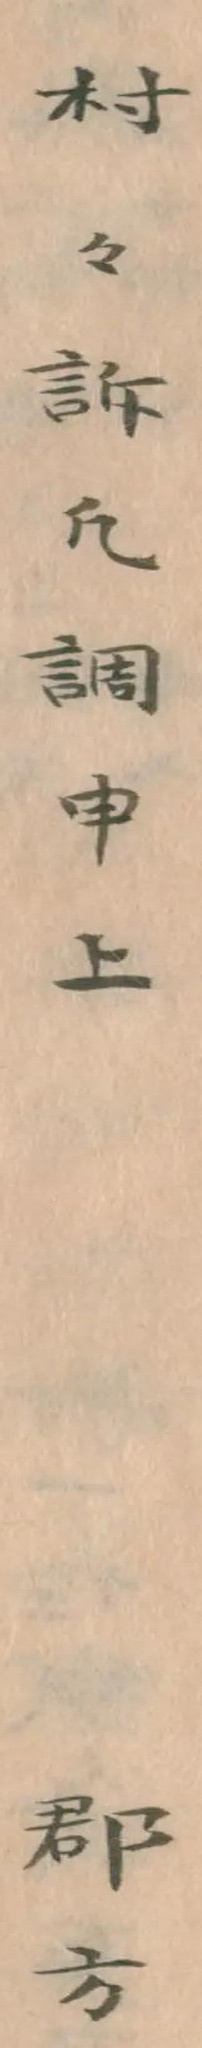村々訴凡調申上郡方
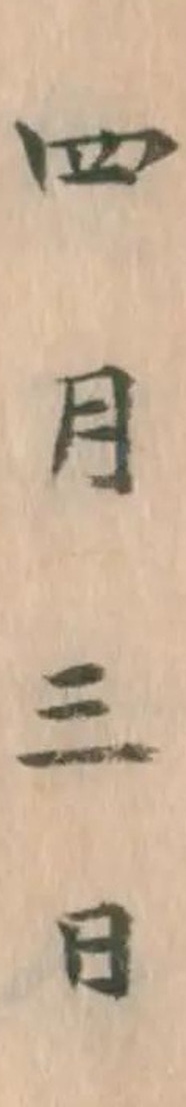四月三日
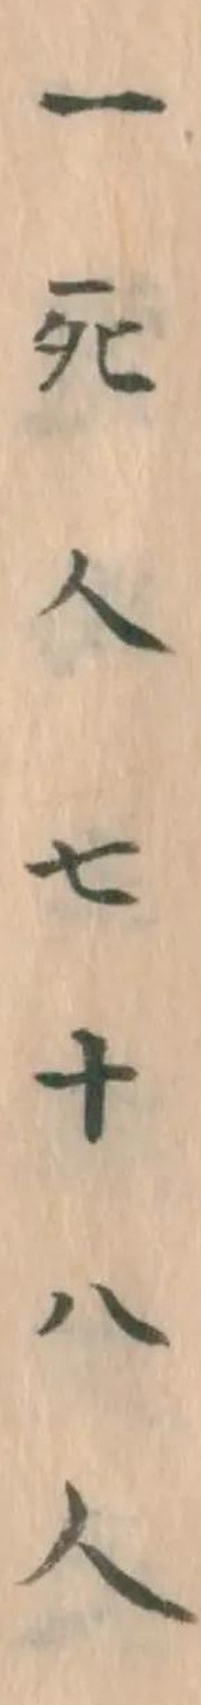一死人七十八人
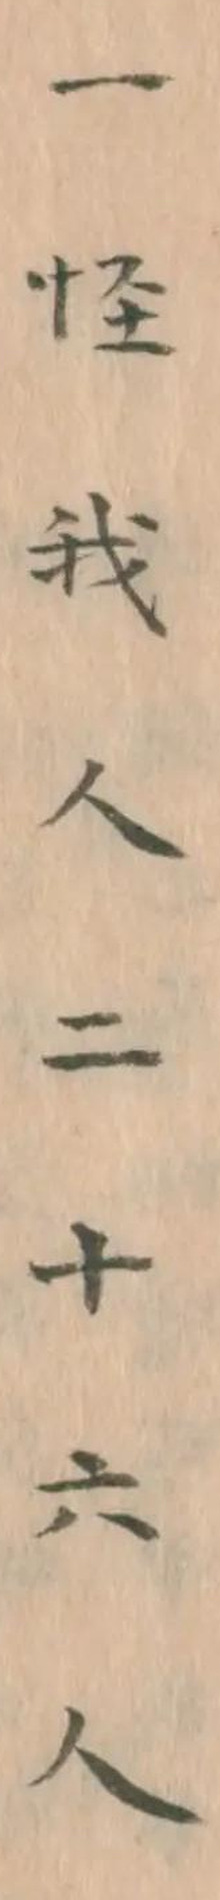一怪我人二十六人

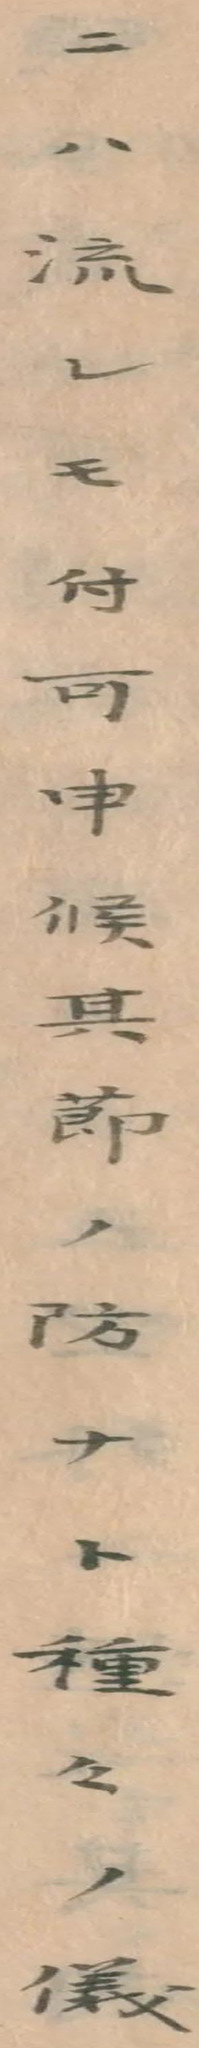ニハ流レモ付可申候其節ノ防ナト種々ノ儀
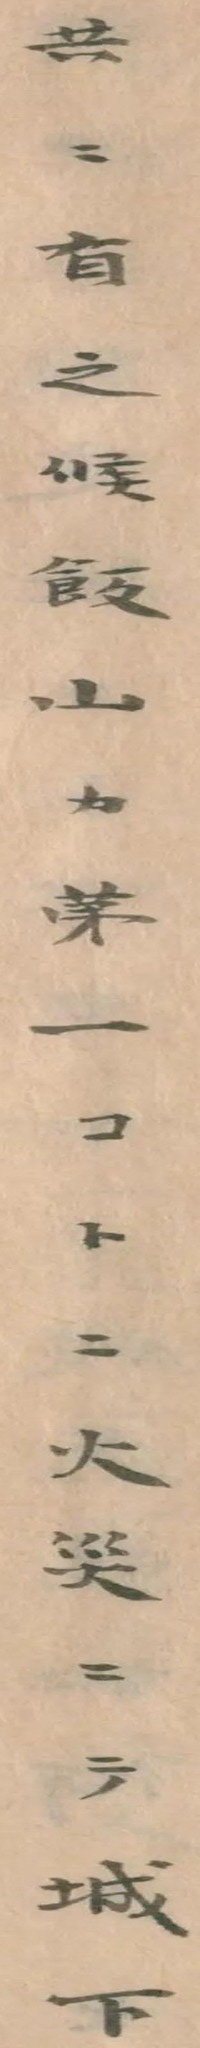共二有之候飯山カ第一͡コトニ火災ニテ城下
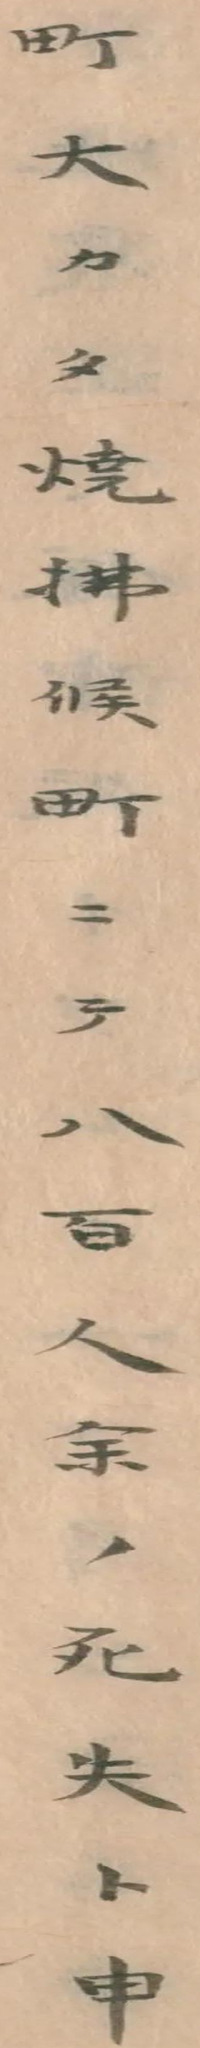町大カタ焼払候町ニテ八百人ノ死失戸ト申
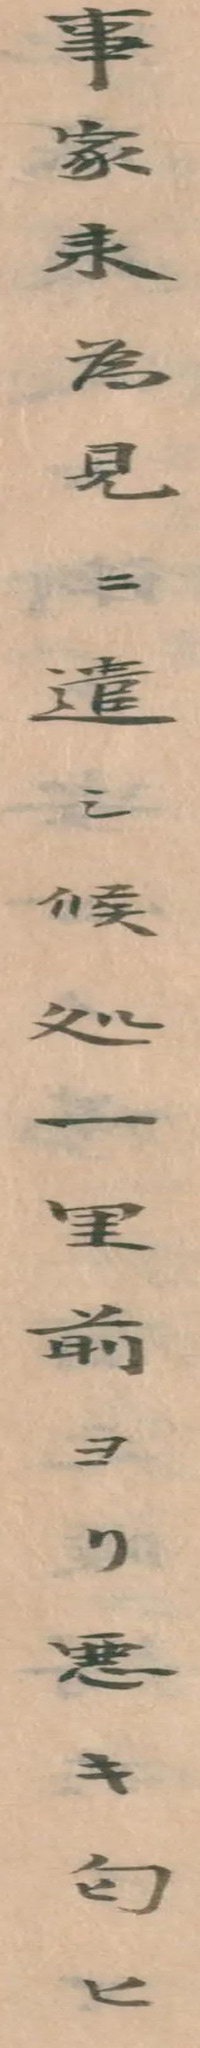事家来為見二遣シ候処一里前ヨリ悪キ匂ヒ
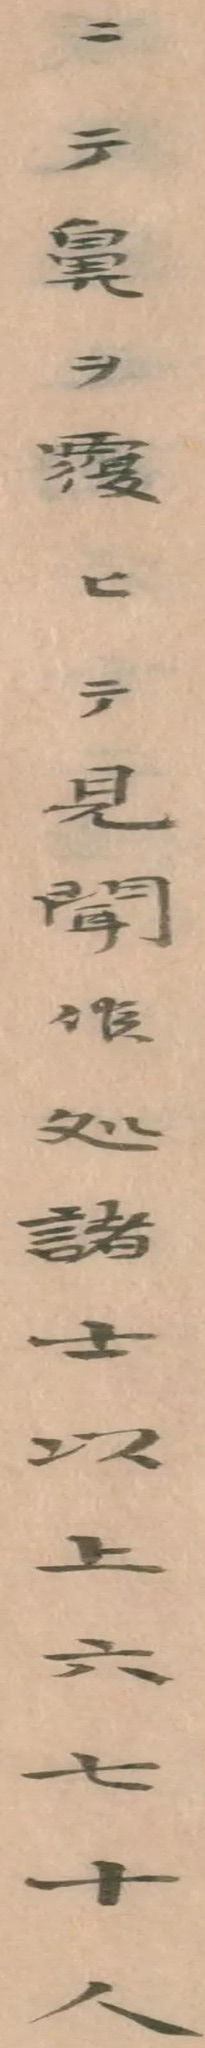ニテ鼻ヲ覆ヒテ見聞候処諸士以上六七十人
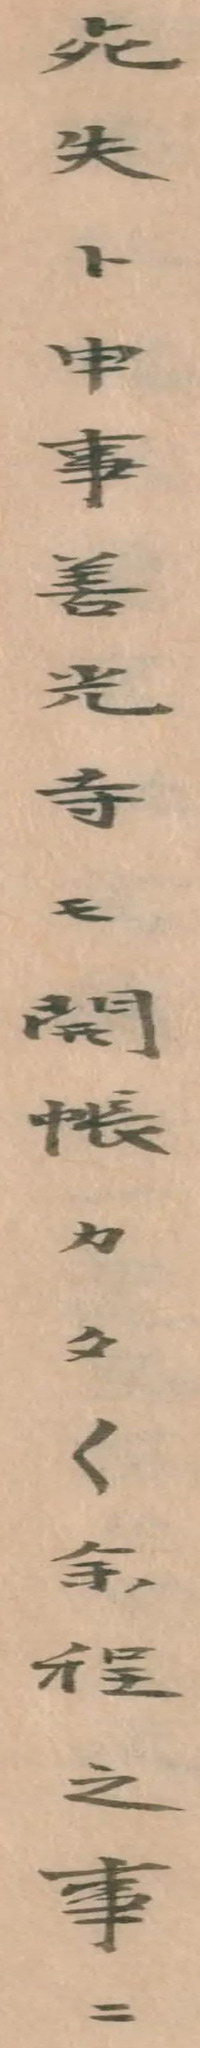死失ト申事善光寺モ開帳カタ〳〵余程之事二
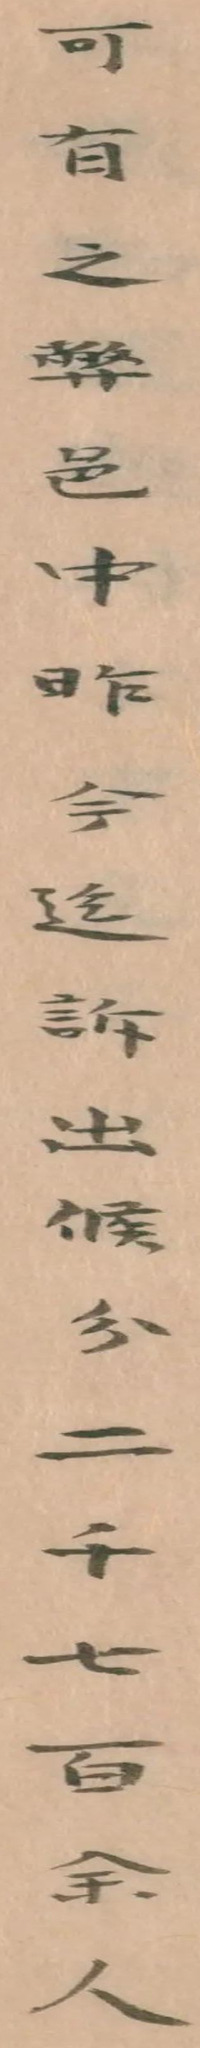可有之幣邑中昨今迄訴出候分二千七百余人
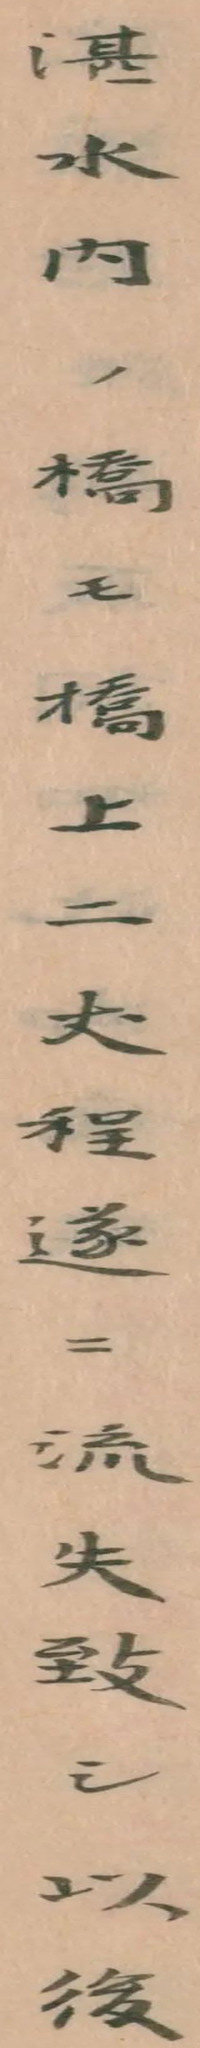湛水内ノ橋モ橋上二丈程遂二流失致シ以後
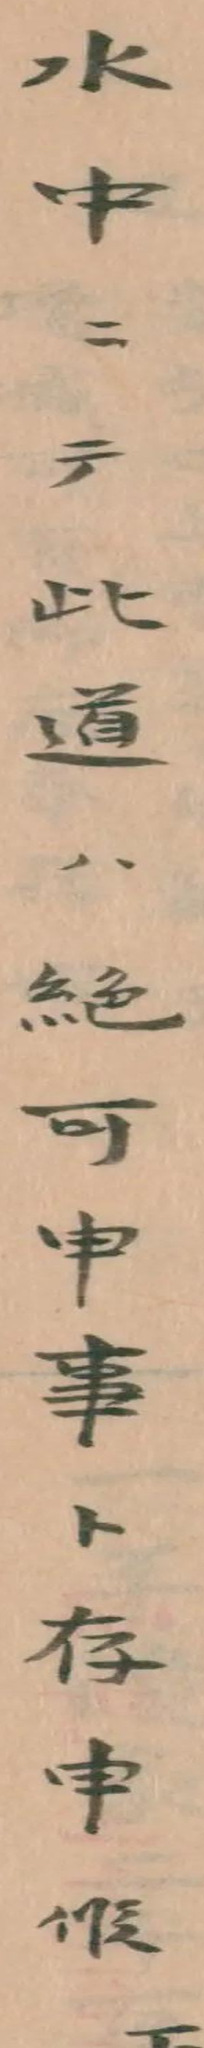水中にニテ此道ハ絶可申事ト存申候下畧
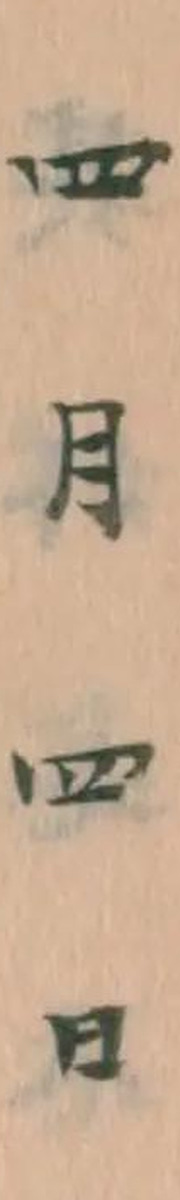四月四日
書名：地災撮要. 巻1(噴火山・地震ノ部)
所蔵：国立国会図書館 National Diet Library, JAPAN
